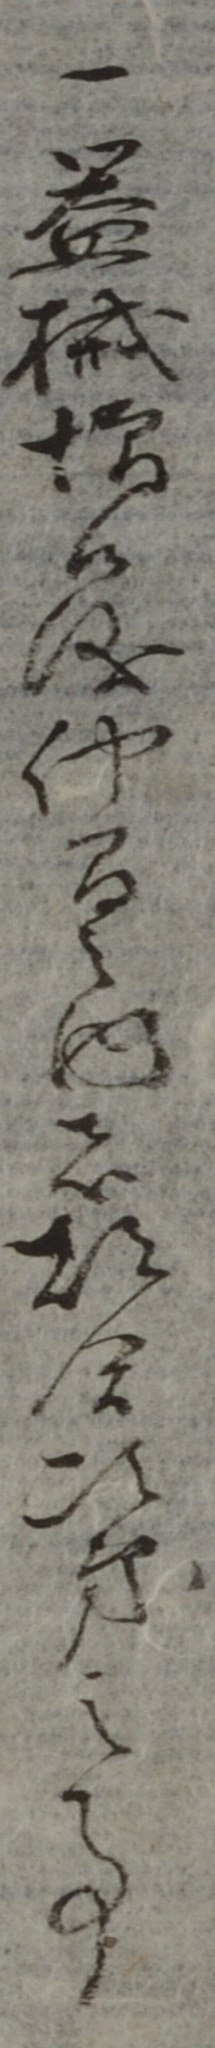一器械増候儀仲間之内は都合次第之事
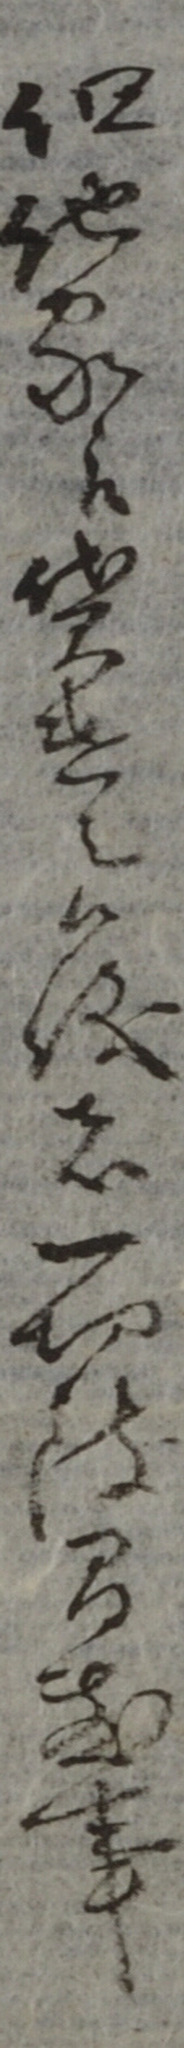但他家江貸遣シ候儀は一切致間敷事
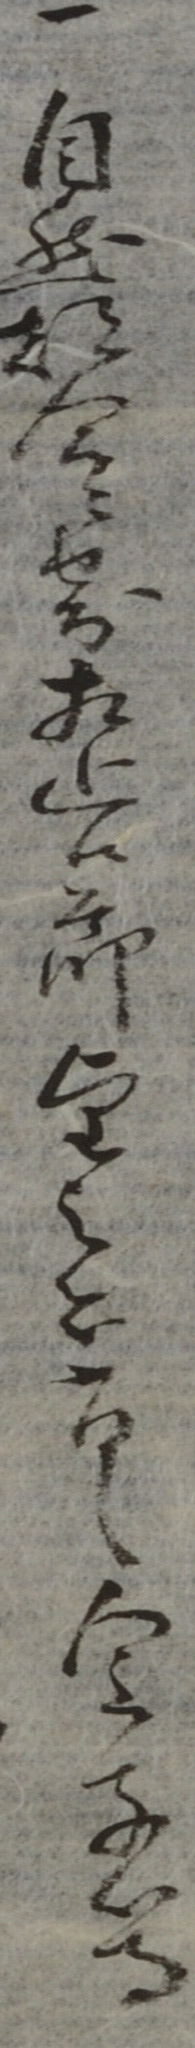一自然都合ニ寄相止候節望之者有之金子等
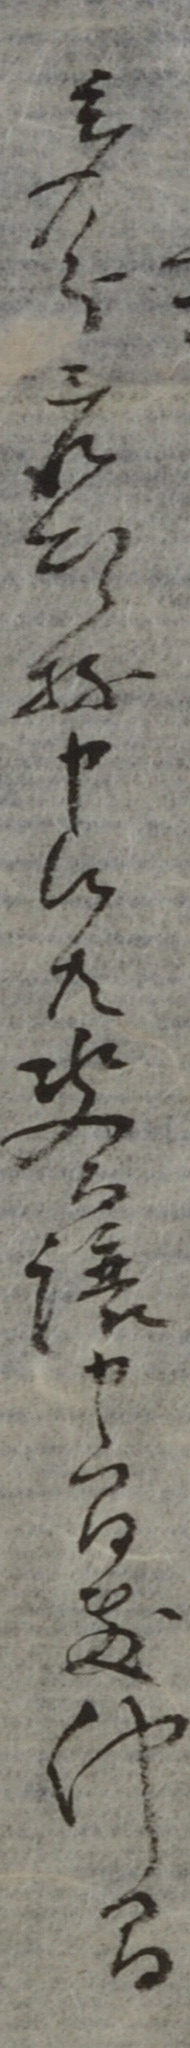之分差出候抔申候共決而譲申間敷仲間
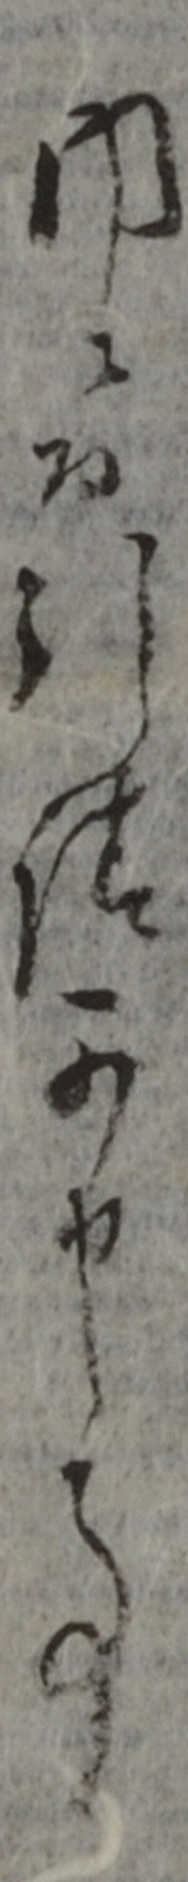内ニ而引請可申事
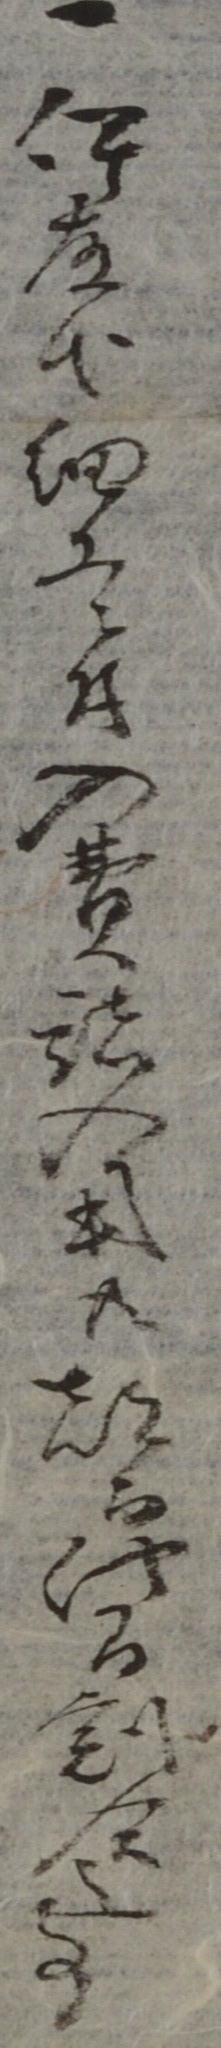一伊藤氏細工ニ付入費諸入用共都而仲間割合之事
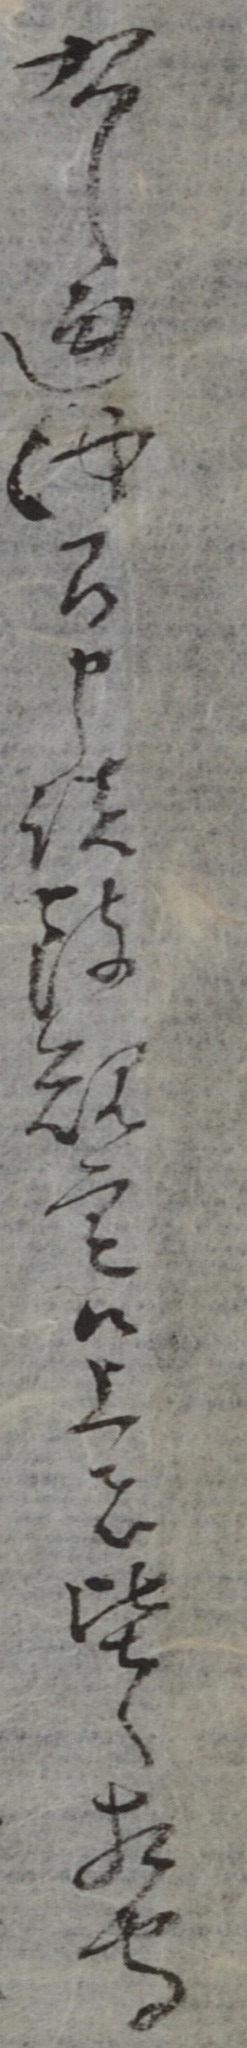右之通仲間申談致規定候上は堅く相守
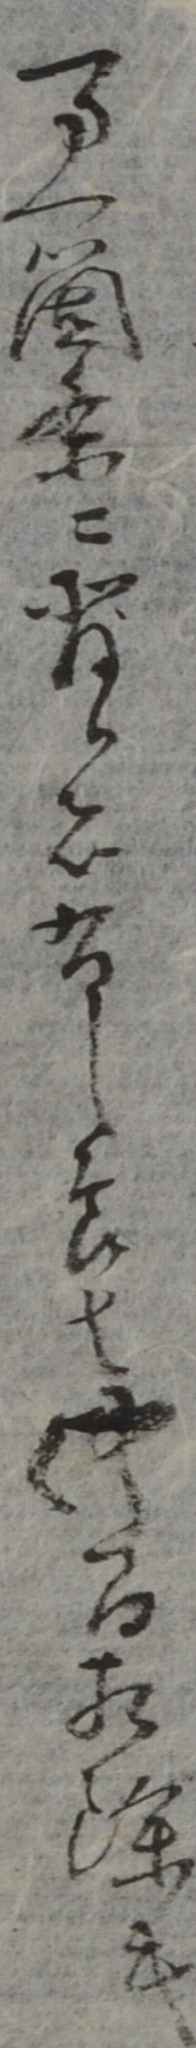万一箇条ニ背候者有之候節は仲間相除キ
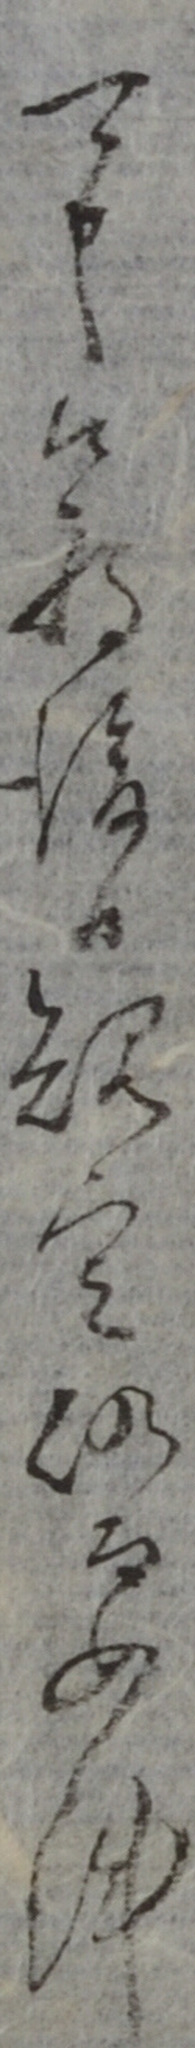可申候為後日規定仍而如件
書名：木綿糸器械仲間規定書（写）
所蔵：伊那市立高遠町図書館・合同会社AMANE
